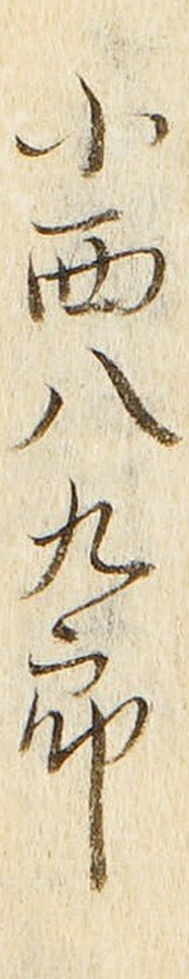小西八九郎
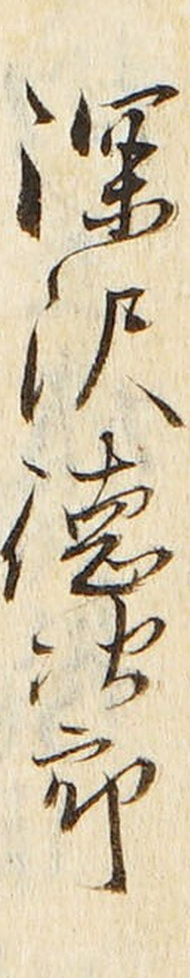深沢徳次郎
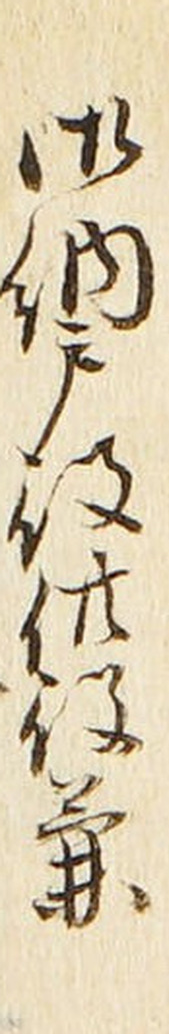御納戸役供役兼
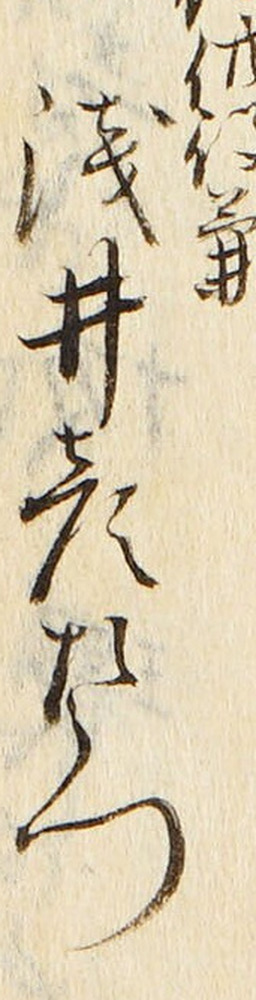浅井彦左衛門
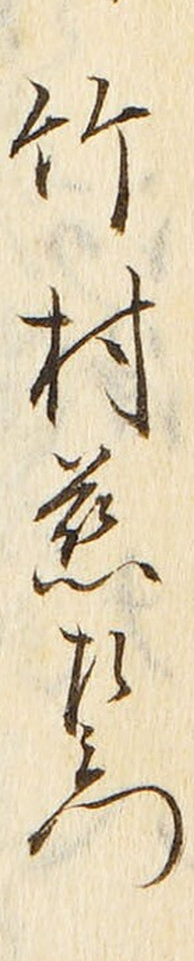竹村慈左衛門
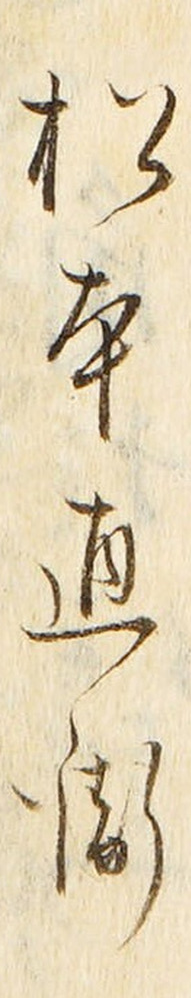松本直樹
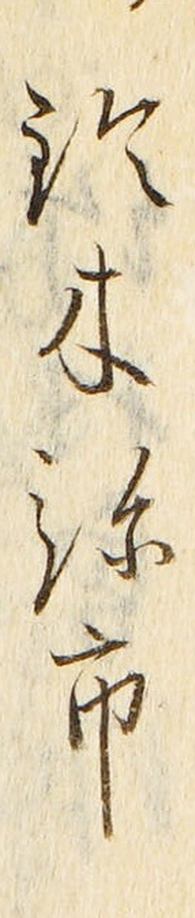鈴木弥市
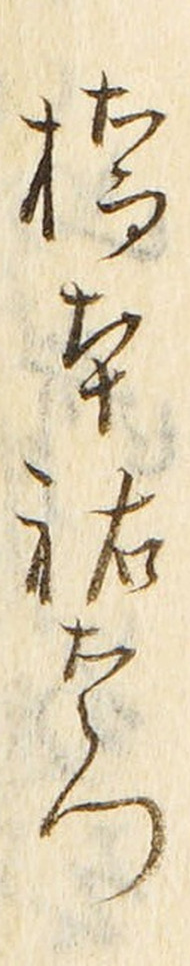橋本祐右衛門
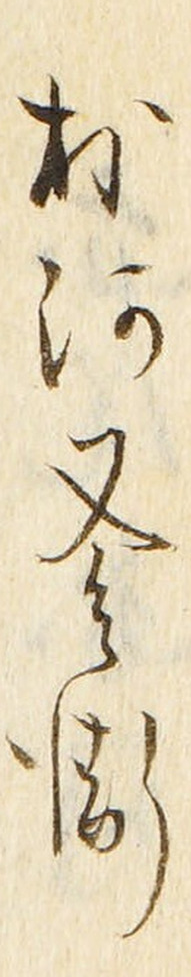相河又兵衛
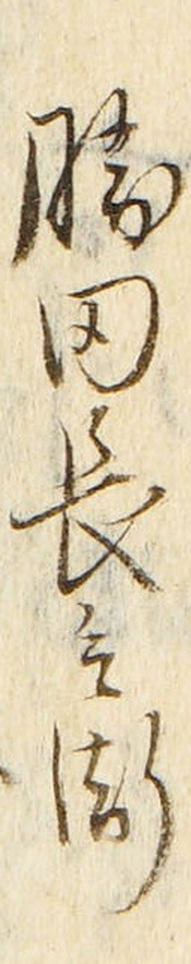勝田長兵衛
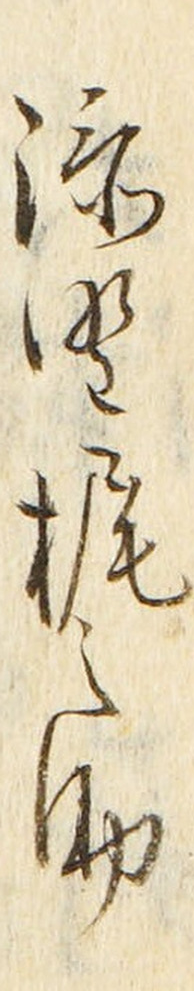添野梶之助
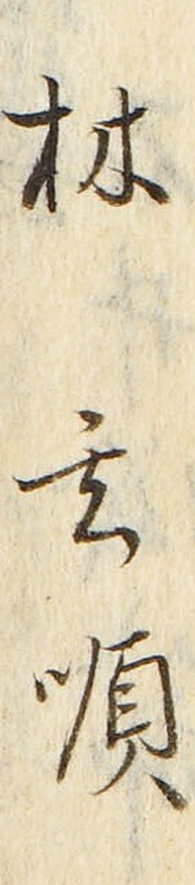林玄順

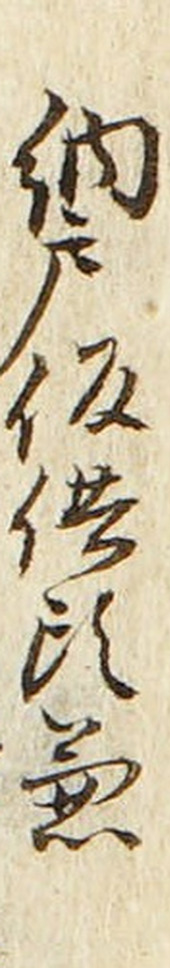納戸仮供頭兼
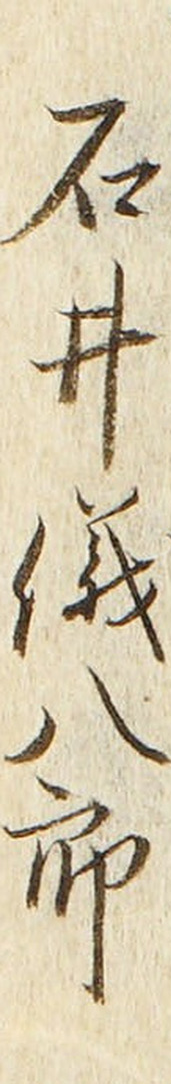石井儀八郎
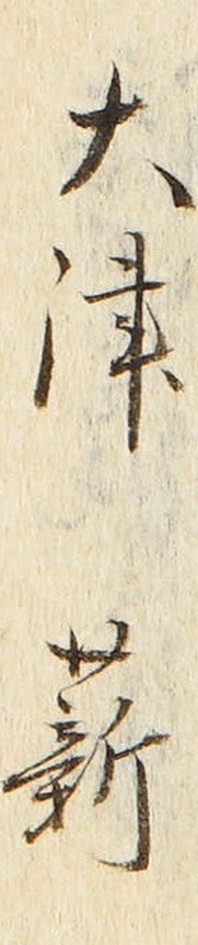大津薪
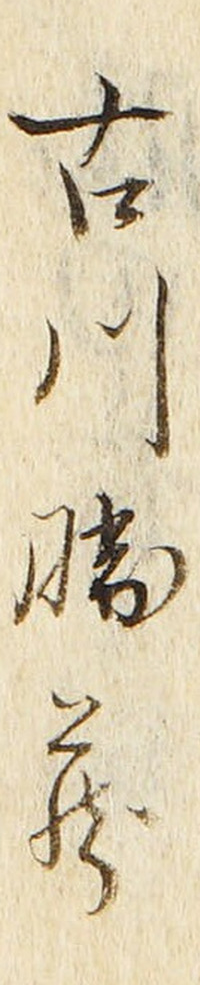古川勝蔵
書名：長崎漂流記
